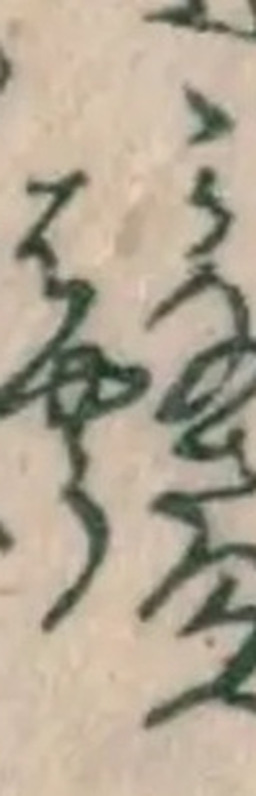はやう
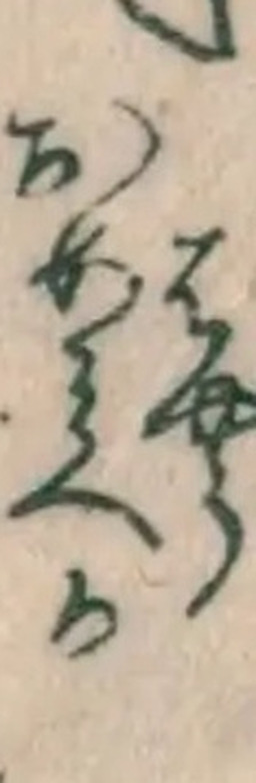おめみへか
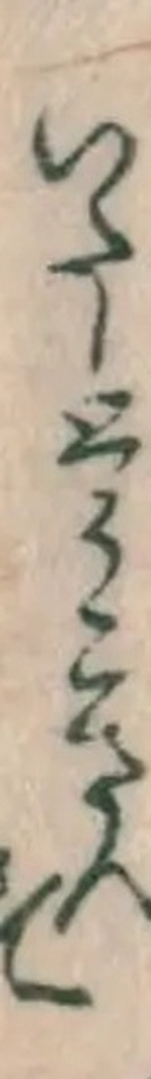いたしとうこさんす

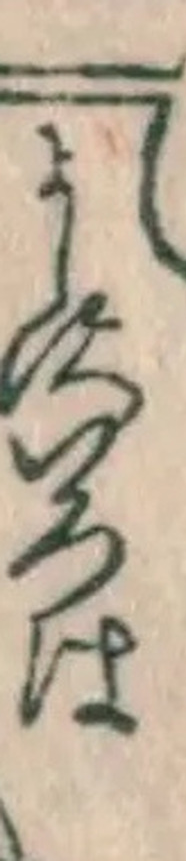よし沢いろは
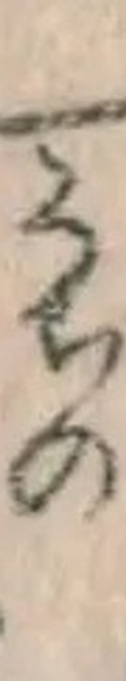うらの
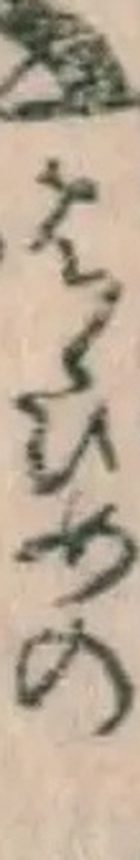はしひめの
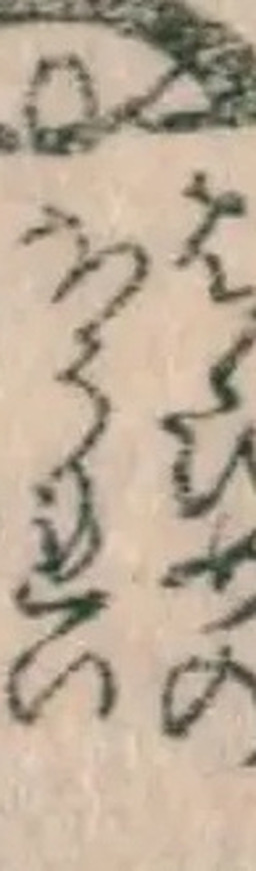ほうれい
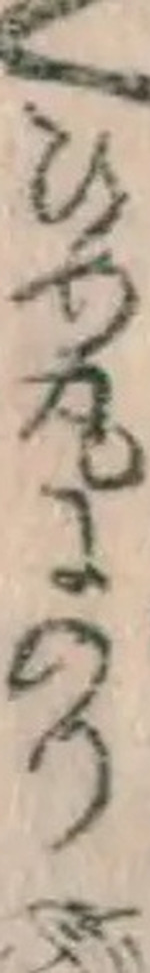ひめ丸にのり
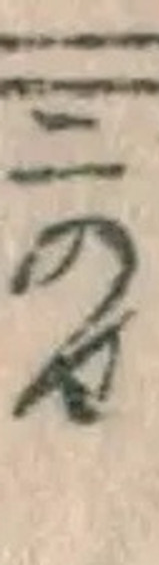二のせ
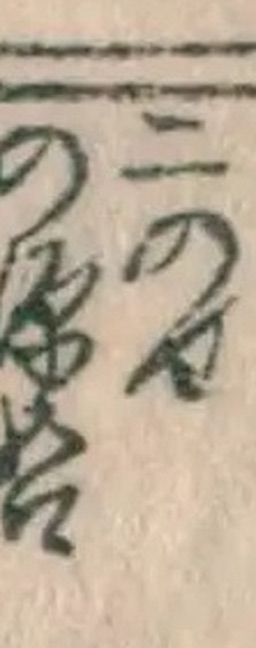の源吾
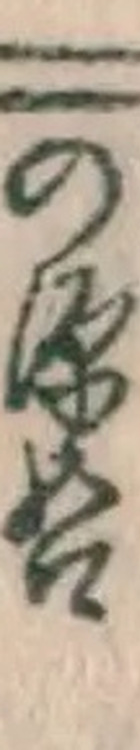の源吾
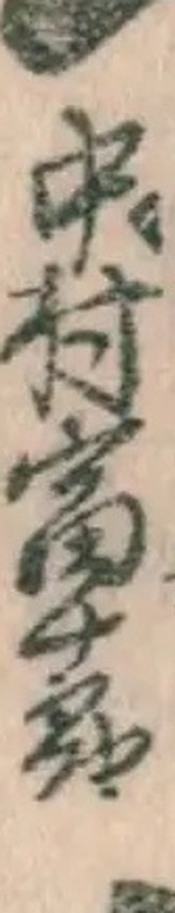中村富十郎
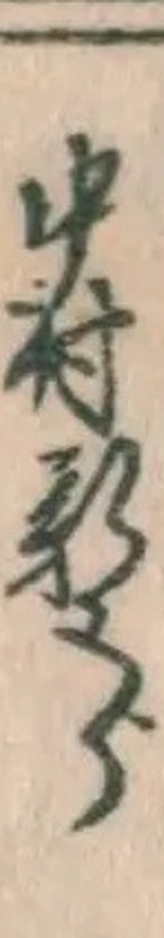中村新五郎
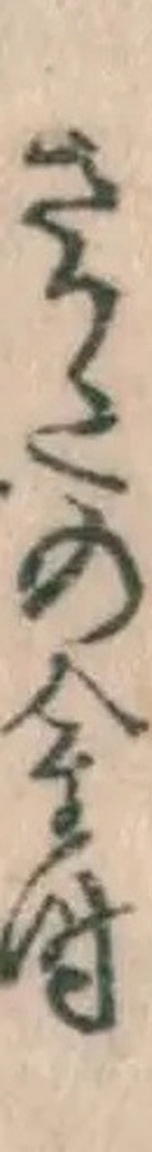さかたの金時
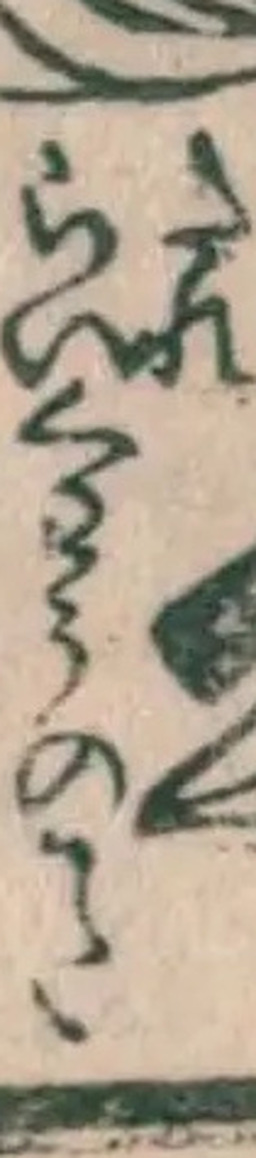らいくわうのかた
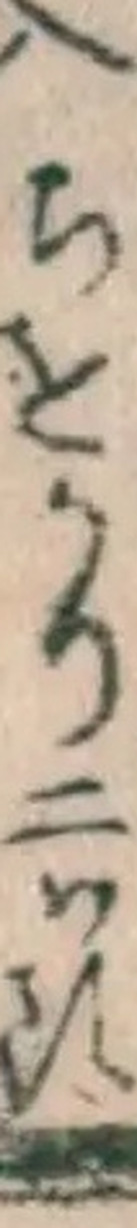ちをかり二つ頭
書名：菊慈童酒宴岩窟
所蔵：国立国会図書館 National Diet Library, JAPAN
